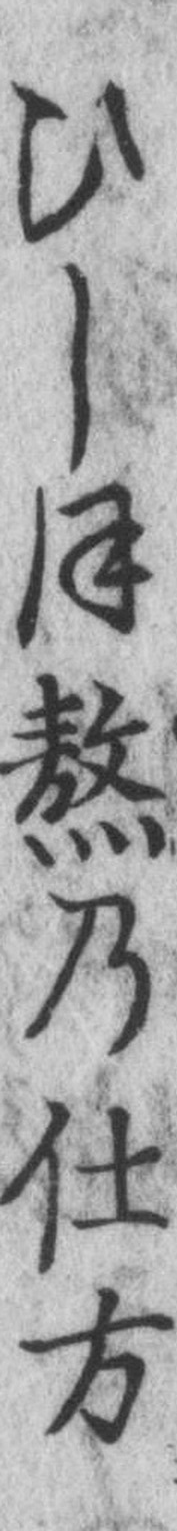ひしほ熬の仕方
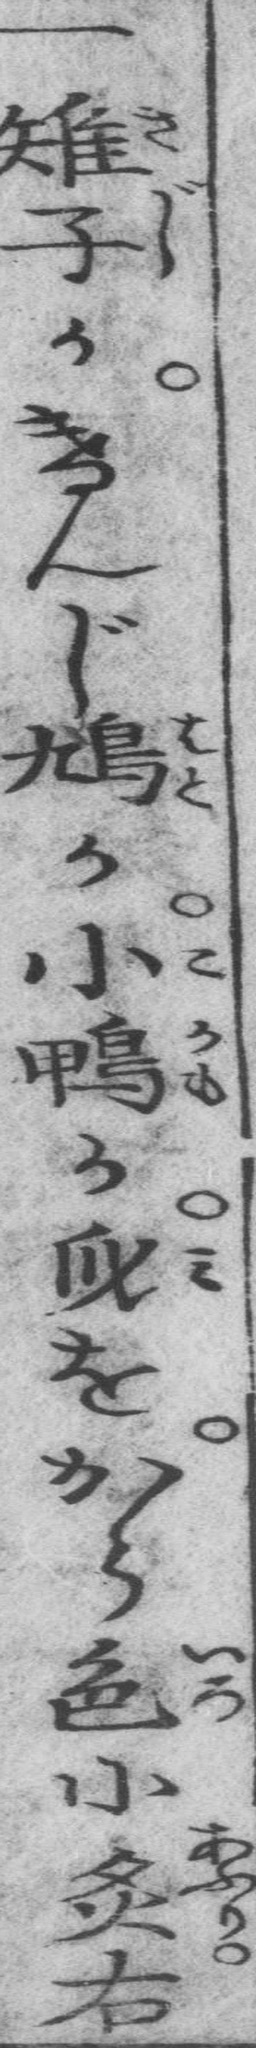一雉子か。けんじ鳩か。小鴨か。身を。から色に炙。右
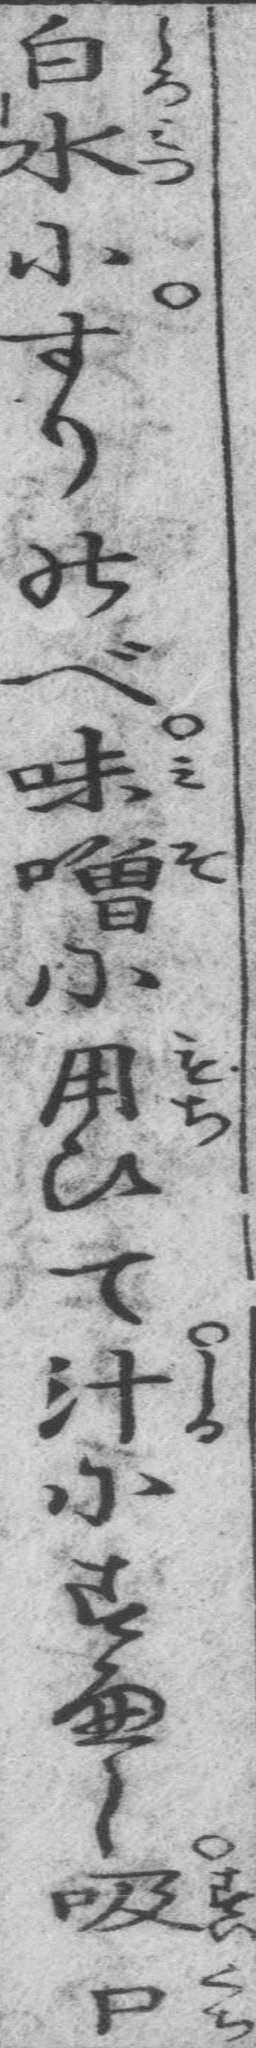白水に。すりのべ。味噌に用ひて。汁にすへし。吸口
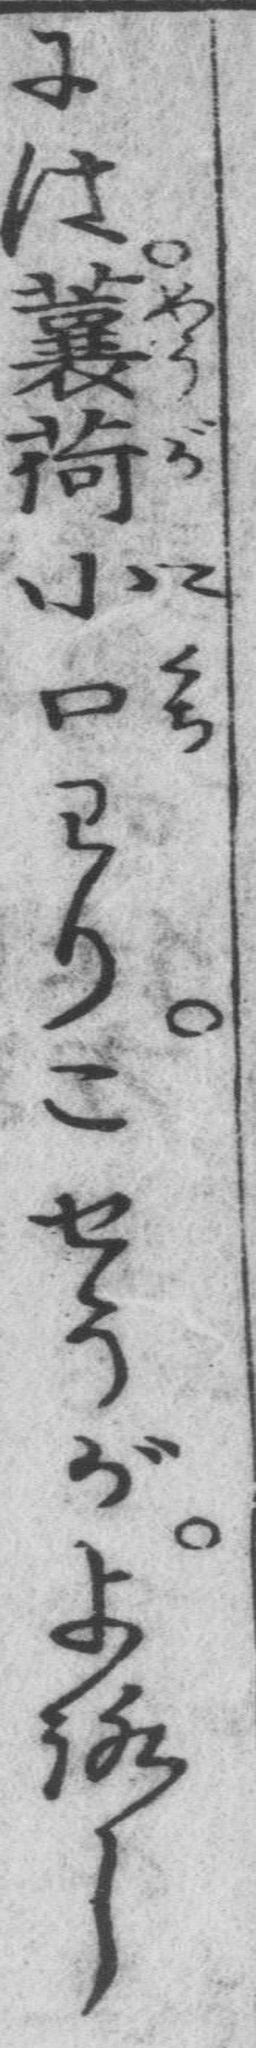には。蘘荷小口わり。こせうが。よろし
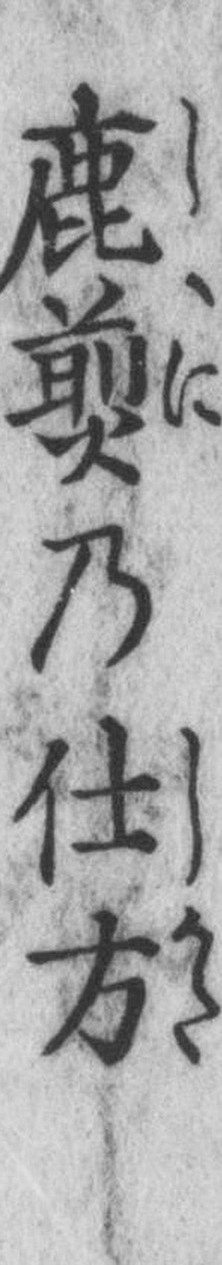鹿煎の仕方
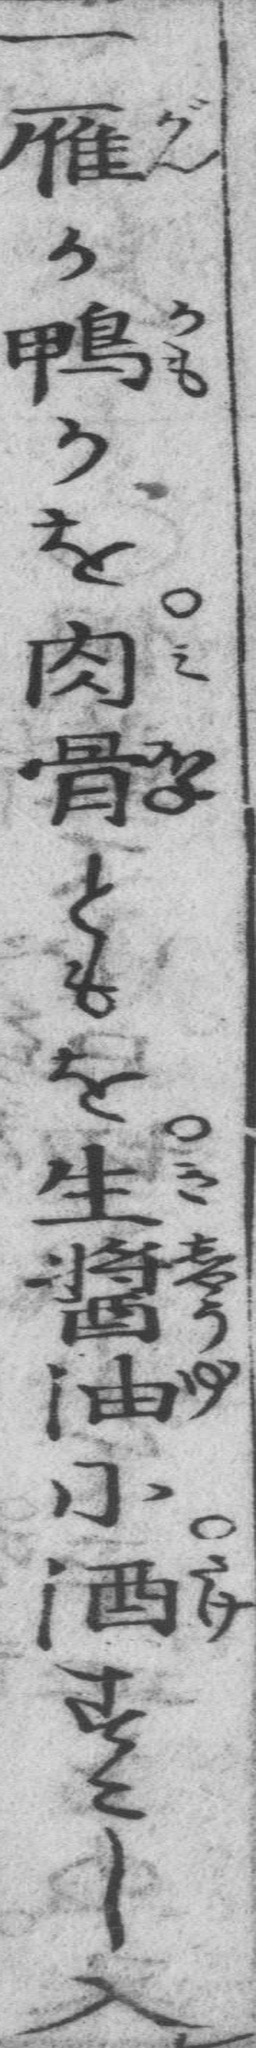一雁か鴨かを。肉骨ともを。生醤油に。酒すこし入れ
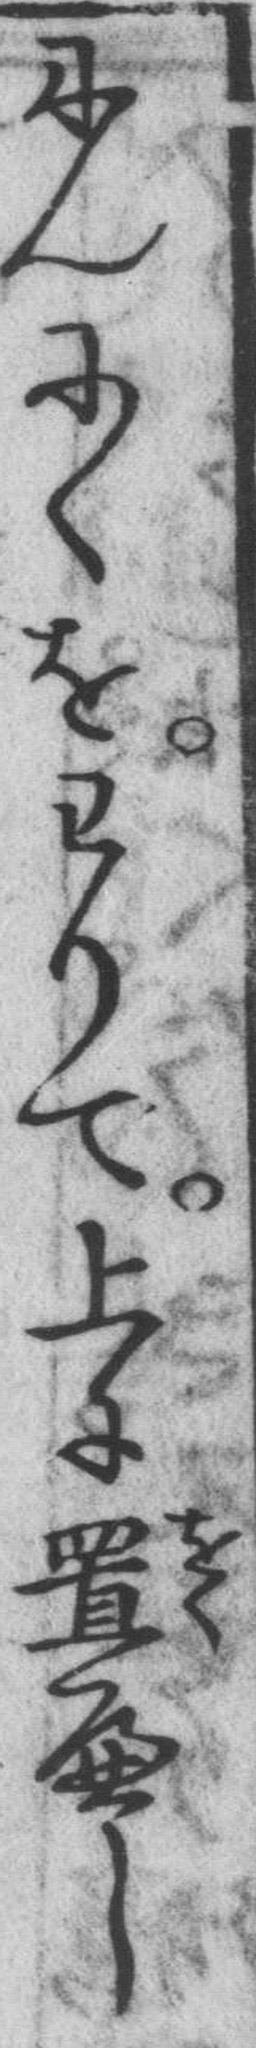にんにくを。わりて。上に置へし
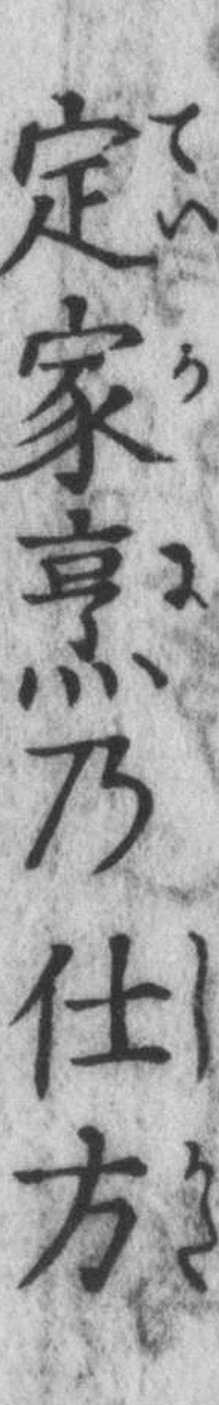定家烹の仕方
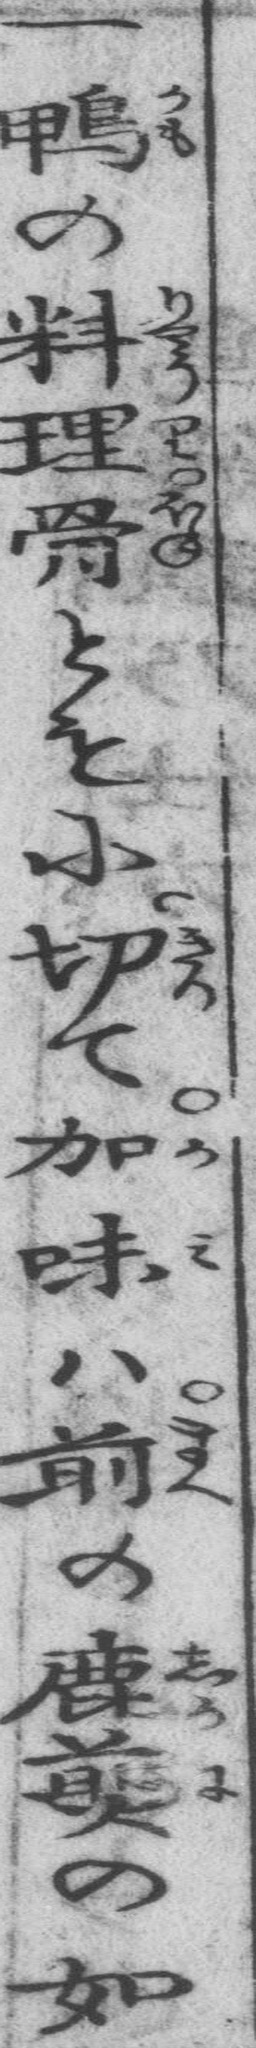一鴨の料理。骨ともに。切て。加味は。前の鹿煎の如
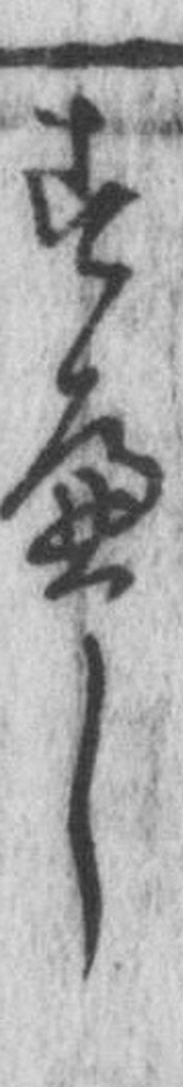すへし
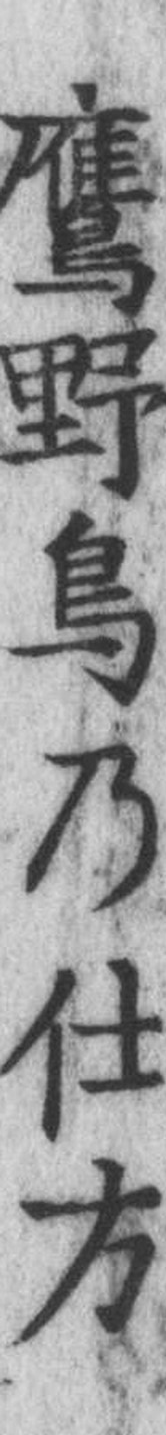鷹野鳥の仕方
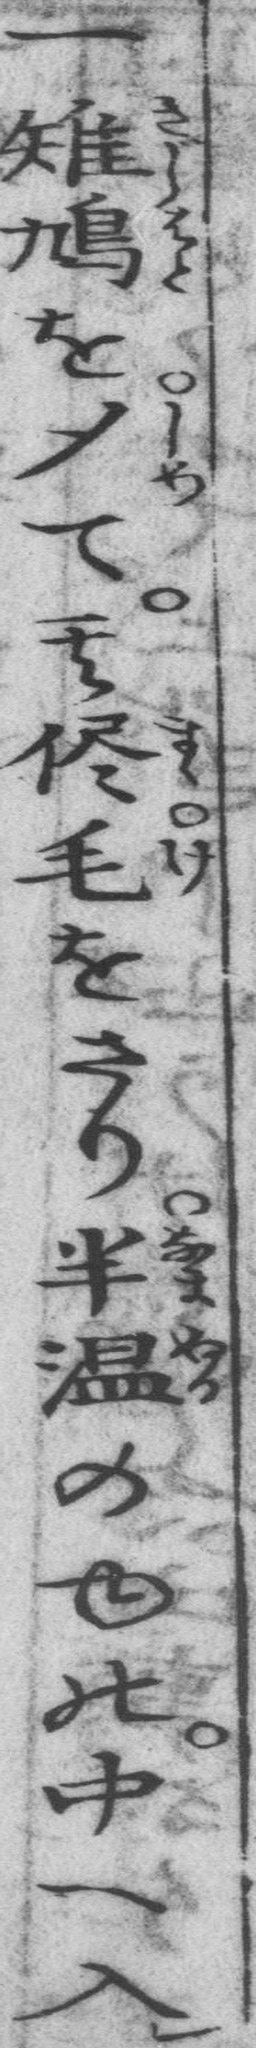一雉鳩を。〆て。其侭。毛をさり。半温のゆの。中へ入れ
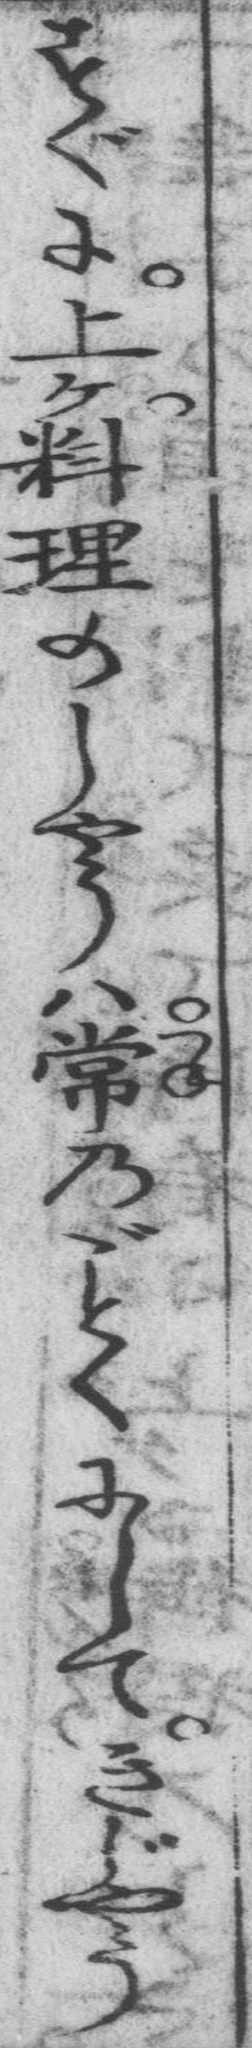すぐに。上け。料理のしやうは。常のごとくにして。きじやう
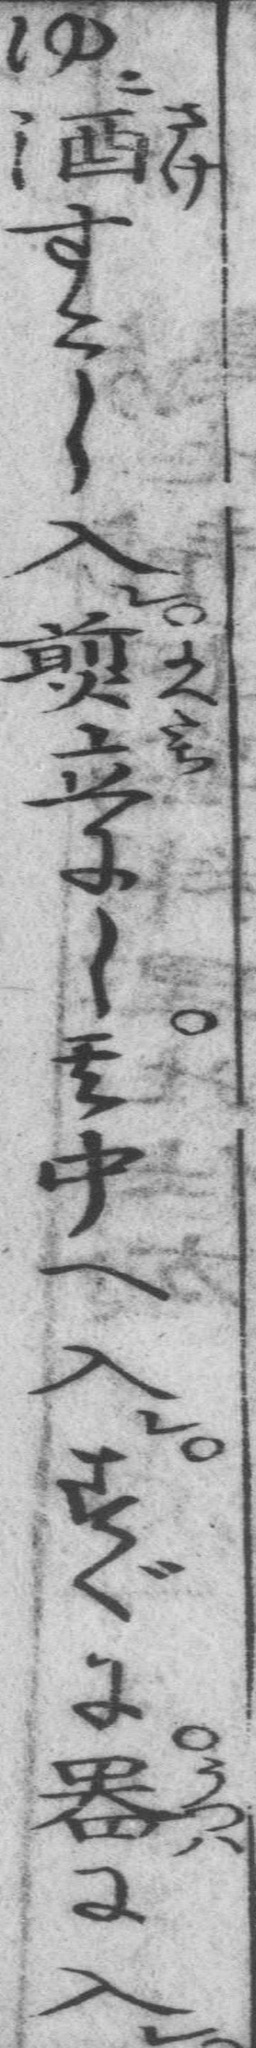ゆに酒すこし入れ。煎立にし。其中へ入れ。すぐに。器に入れ。
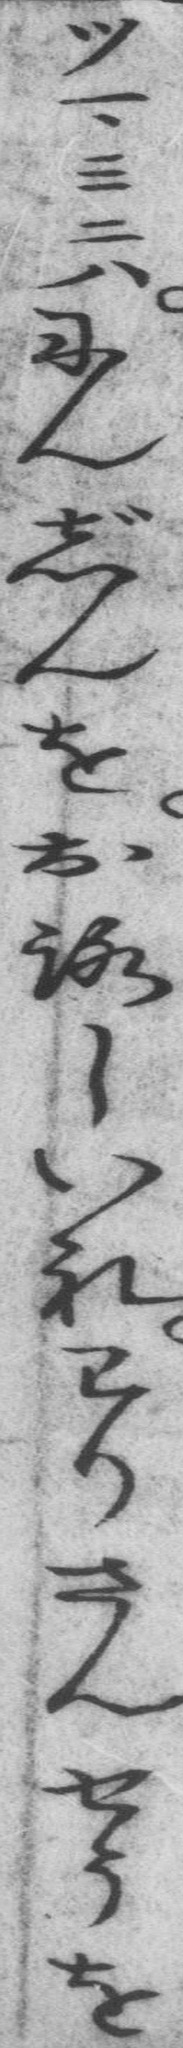つまみには。にんじんを。おろしいれ。わりさんせうを。

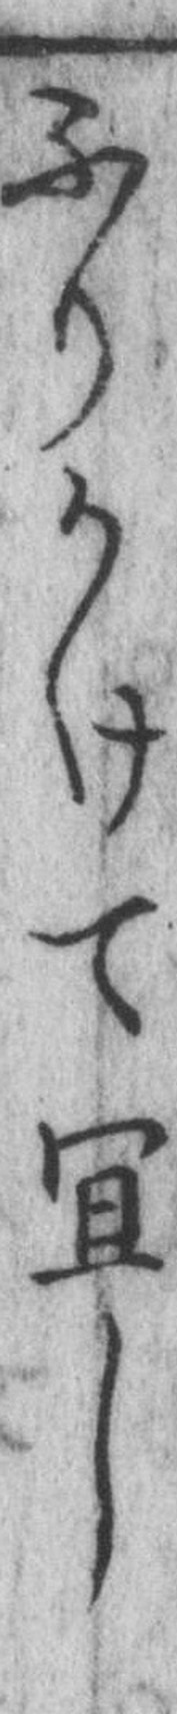ふりかけて。宜し
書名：萬寳料理秘密箱
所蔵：大阪府立大学学術情報センター 国文学研究資料館
